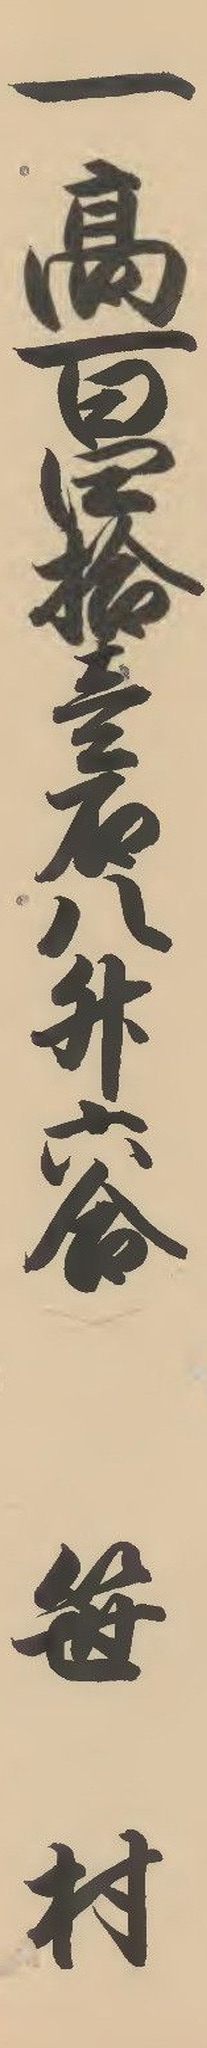一髙百四拾壱石八升六合笹村
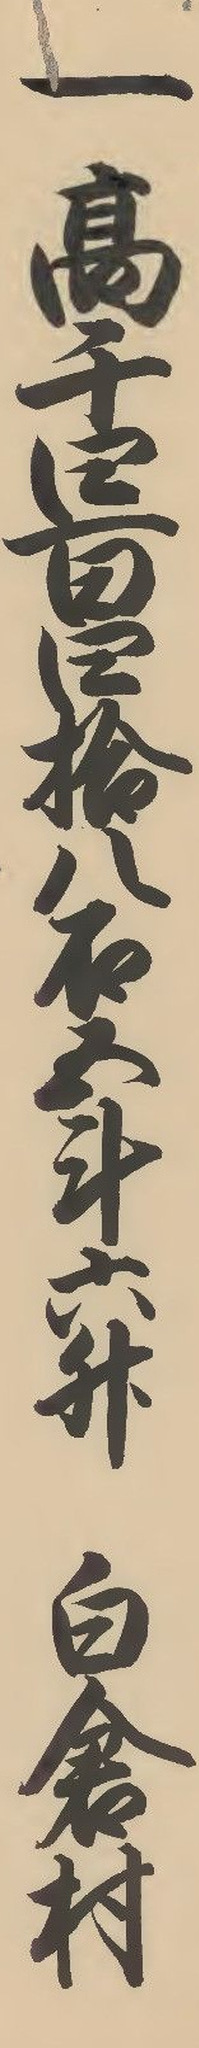一髙千四百四拾八石五斗六升白倉村
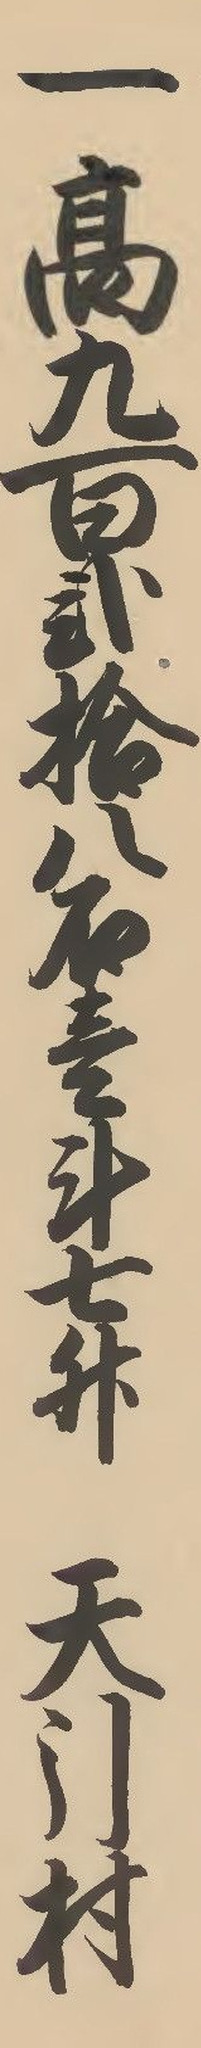一髙九百弐拾八石壱斗七升天川村
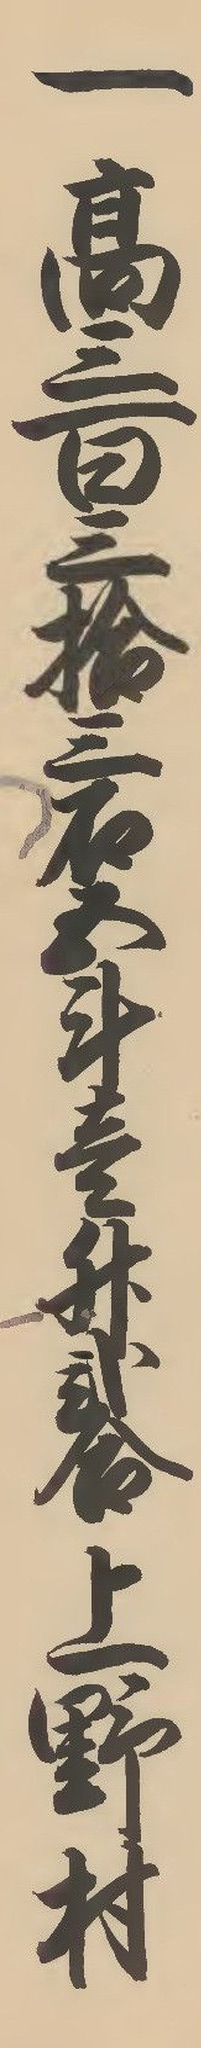一髙三百三拾三石五斗壱升弐合上野村

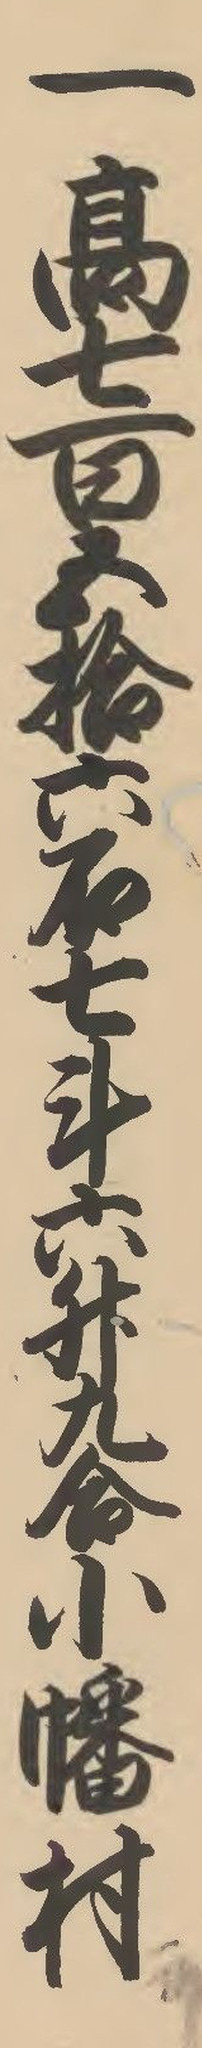一髙七百五拾六石七斗六升九合小幡村
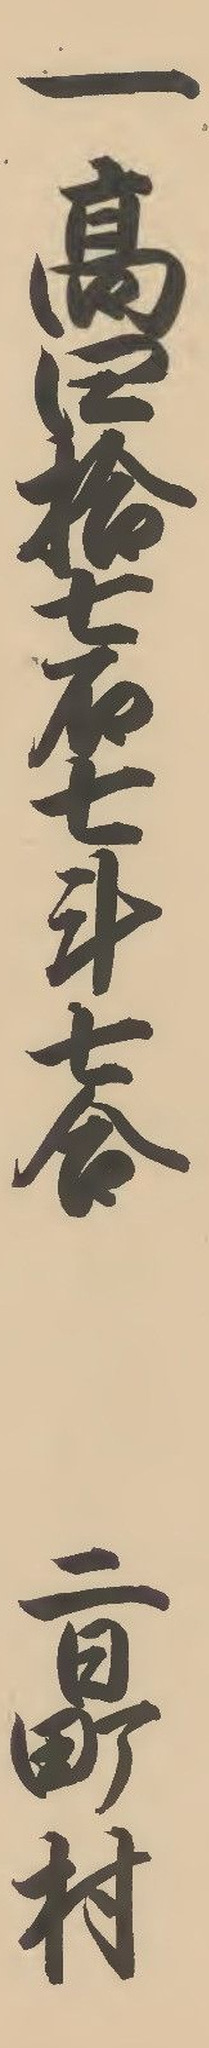一髙四拾七石七斗七合二日町村
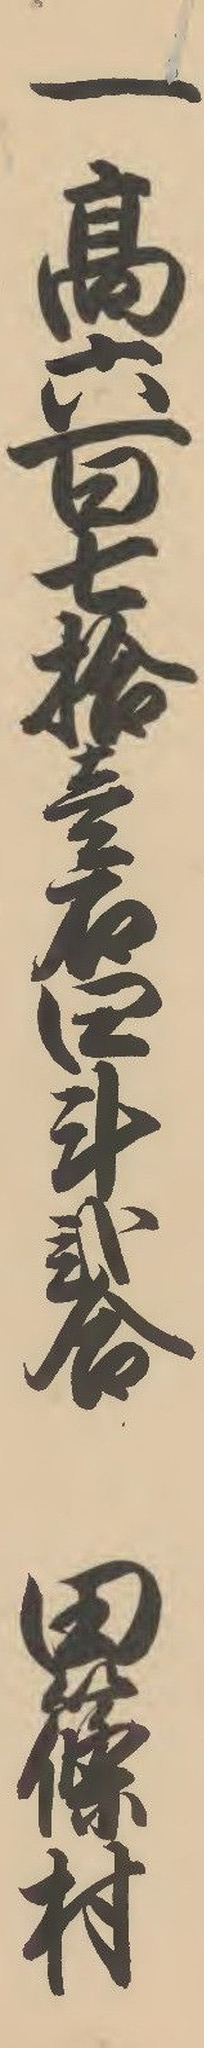一髙六百七拾壱石四斗弐合田篠村
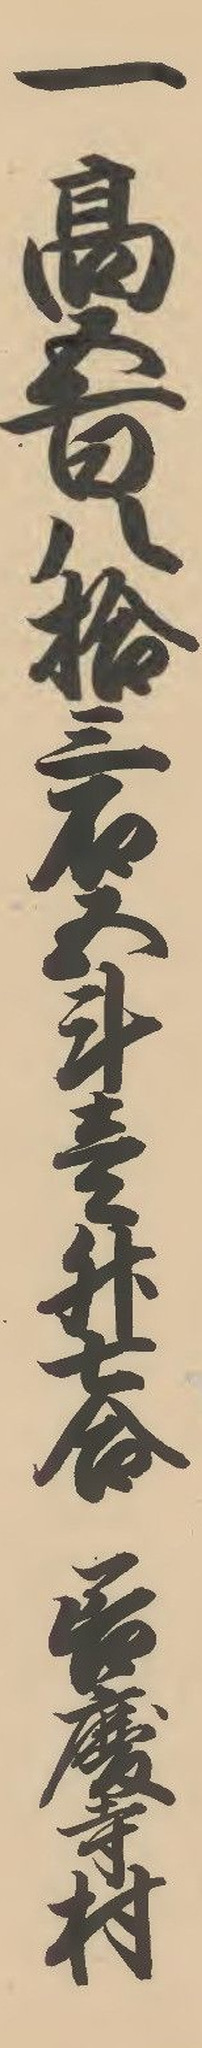一髙五百八拾三石五斗壱升七合善慶寺村
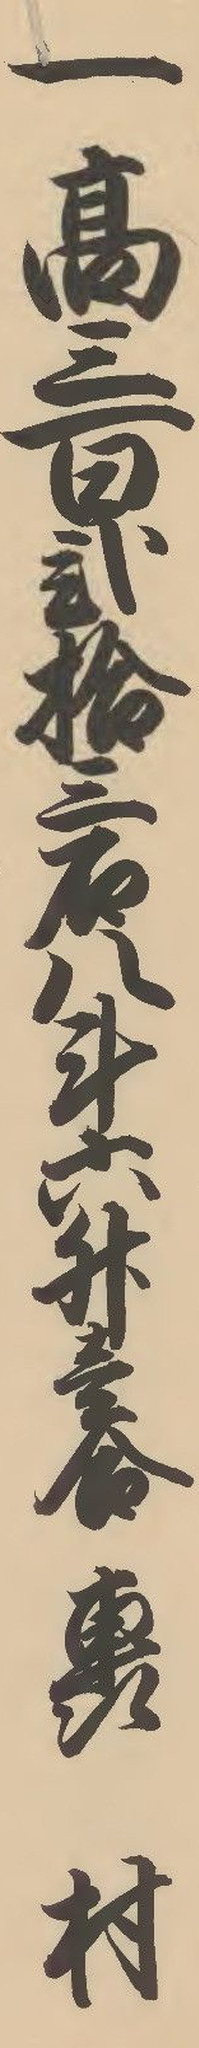一髙三百弐拾三石八斗六升壱合轟村
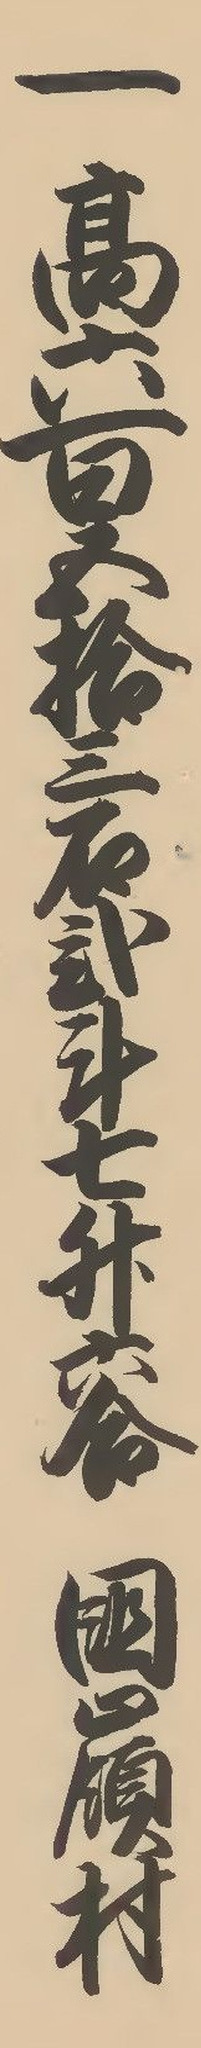一髙六百五拾三石弐斗七升六合国領村

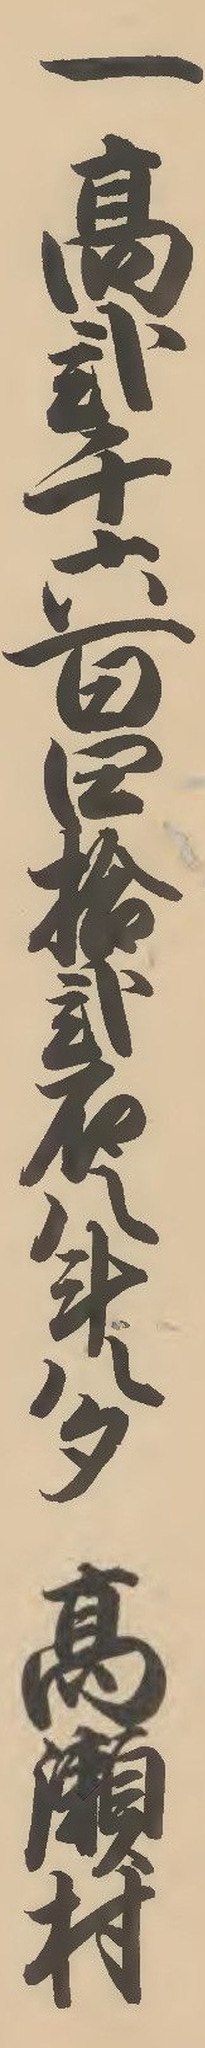一髙二千六百四拾弐石八斗八夕髙瀬村
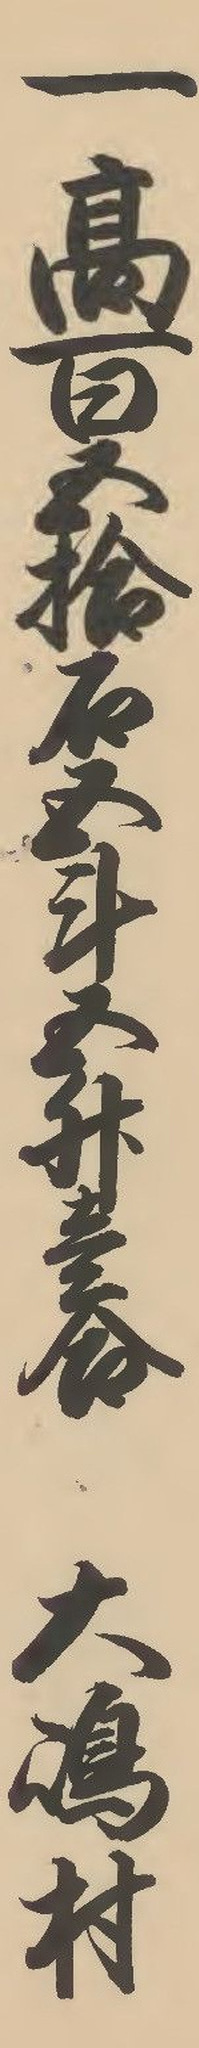一髙百五拾石五斗五升壱合大嶋村
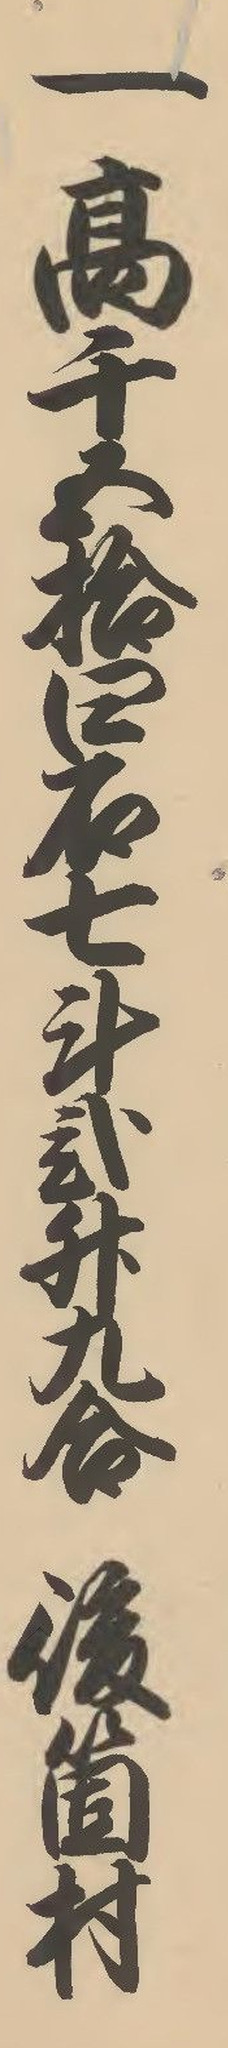一髙千五拾四石七斗弐升九合後箇村
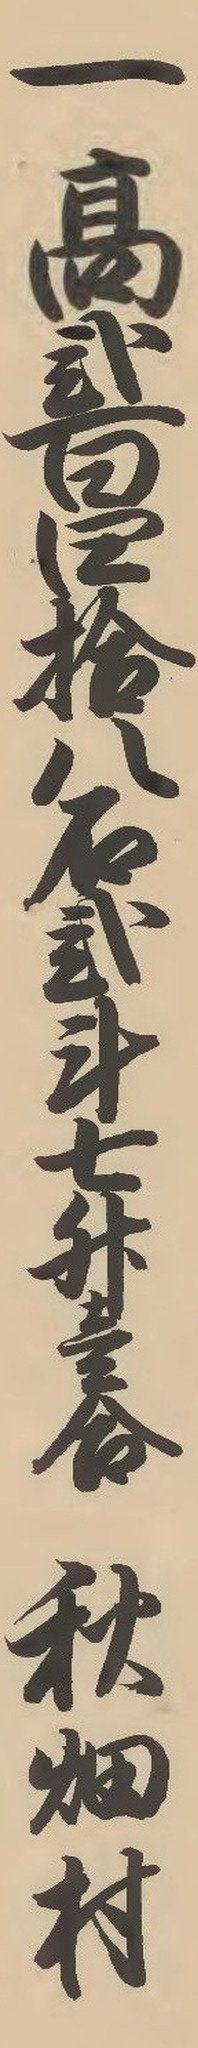一髙弐百四拾八石弐斗七升壱合秋畑村
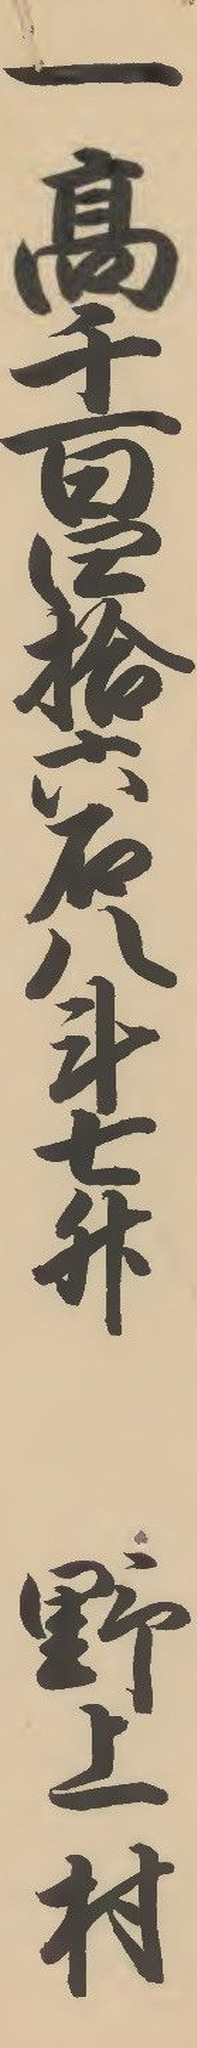一髙千百四拾六石八斗七升野上村
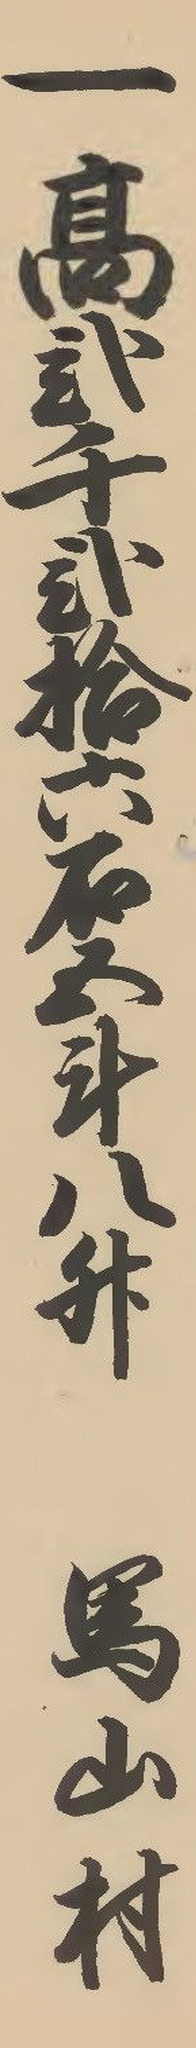一髙弐千弐拾六石五斗八升馬山村
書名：上野国郷帳
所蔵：国立公文書館 National Archives of Japan
